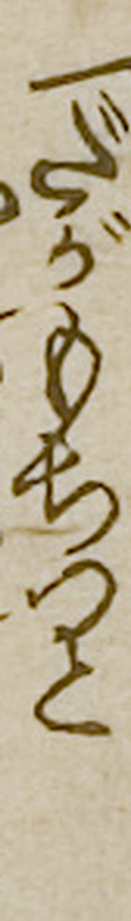〽だがもちつと
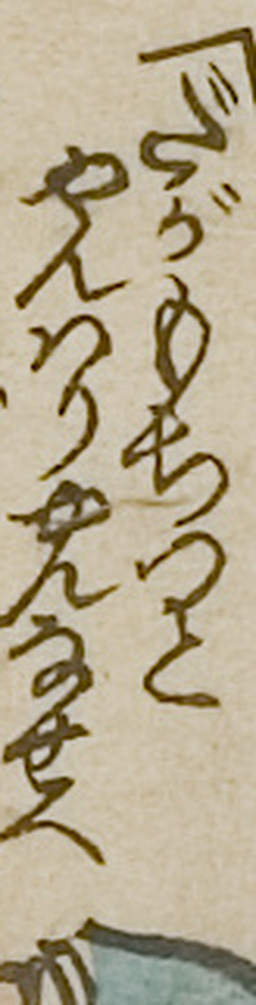やんハりやんなせへ
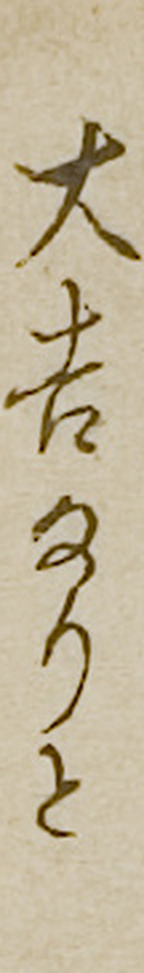大吉なりと
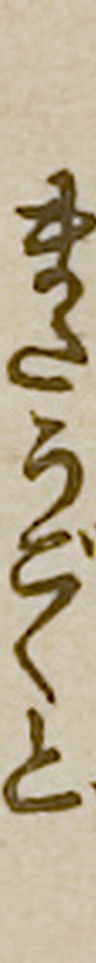またうごくと
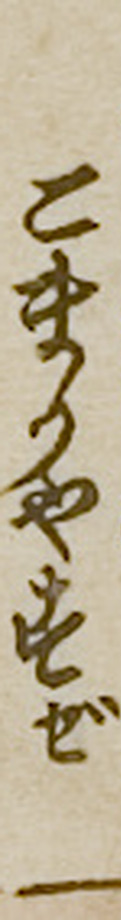こまりやすゼ
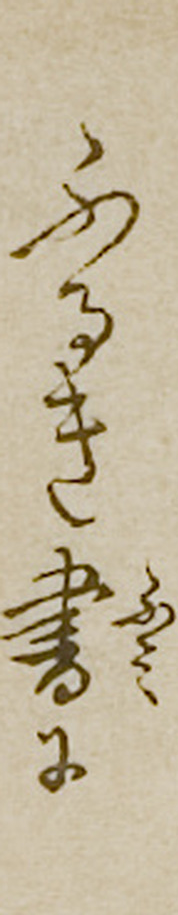ふるき書に
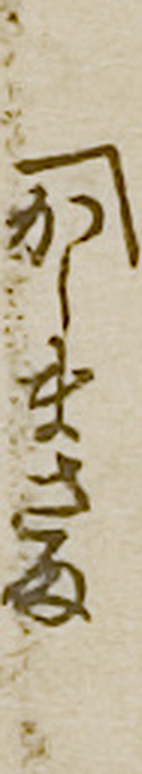〽かしまさま
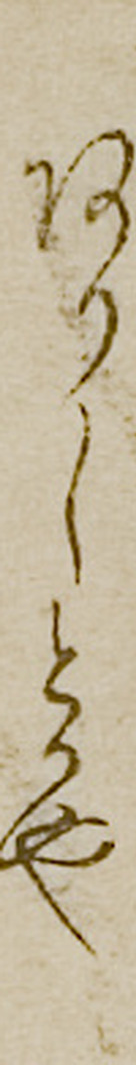ありしとかや
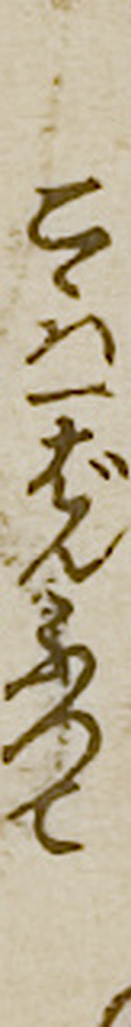こゝハ一ばんふつて
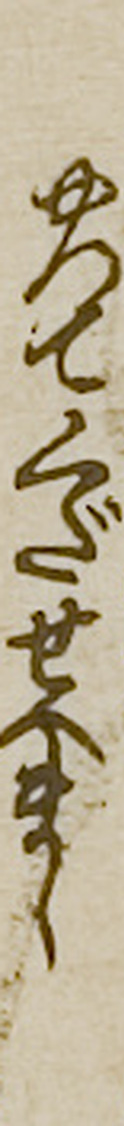やつてくだせへまし
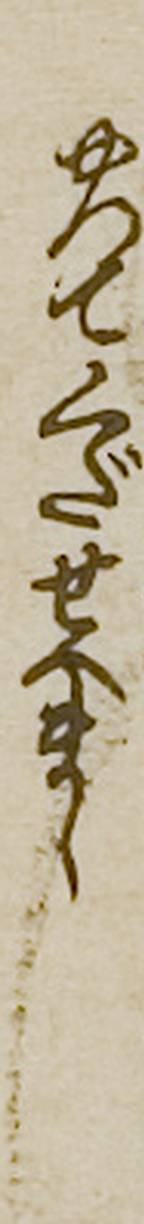やつてくだせへまし
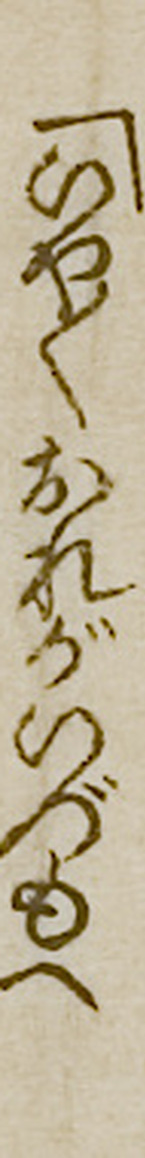〽いや〳〵おれがいづもへ
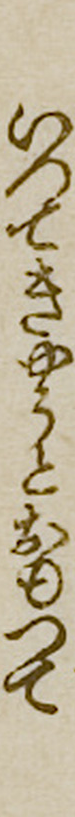いつてきやうとおもつて
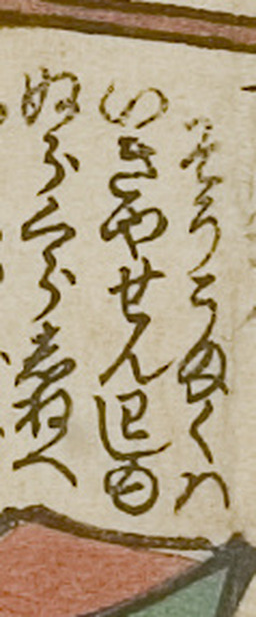いきやせんわしも
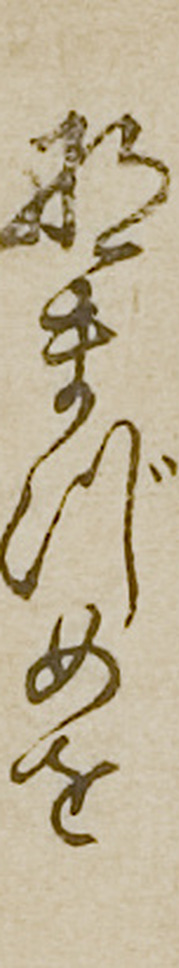なまづめを
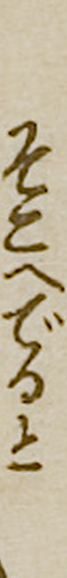そとへでると
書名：[鯰と鹿島大明神の首引]
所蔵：東京大学総合図書館 General Library in the University of Tokyo, JAPAN
